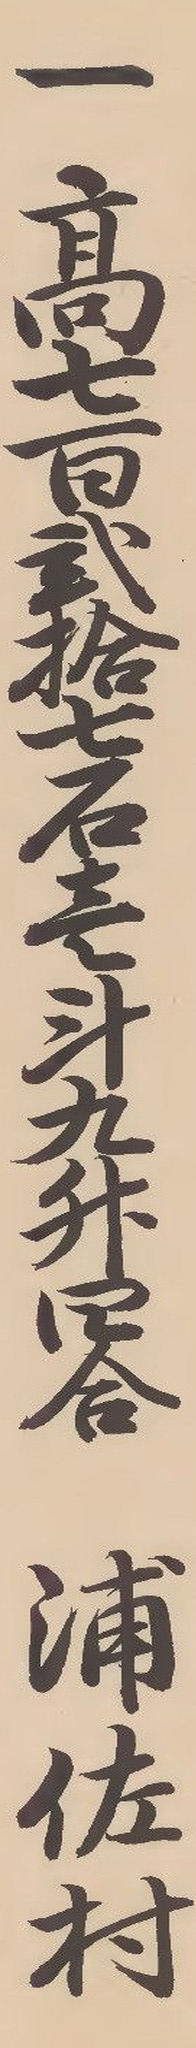一高七百弐拾七石壱斗九升四合浦佐村
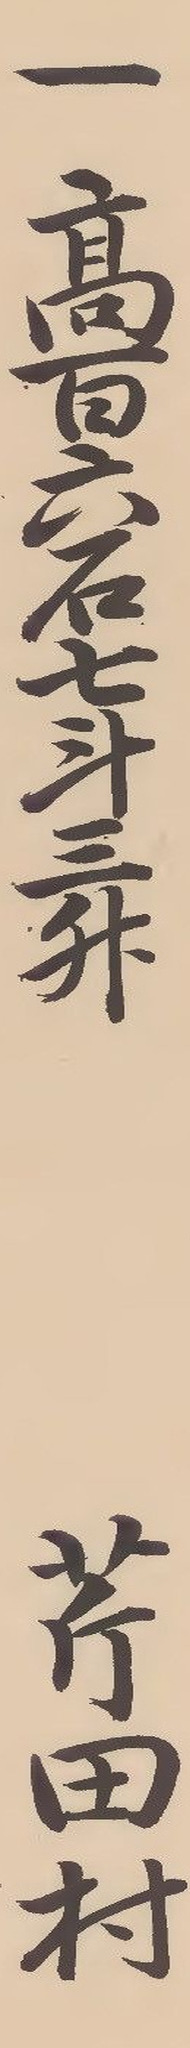一高百六石七斗三升芹田村
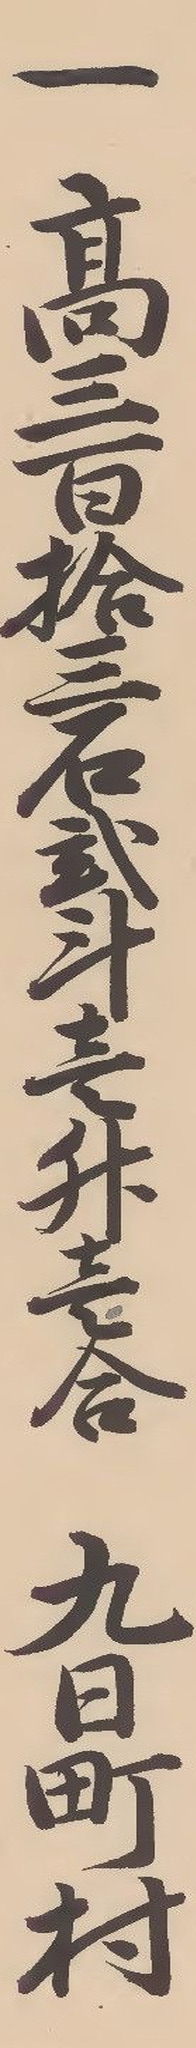一高三百拾三石弐斗壱升壱合九日町村

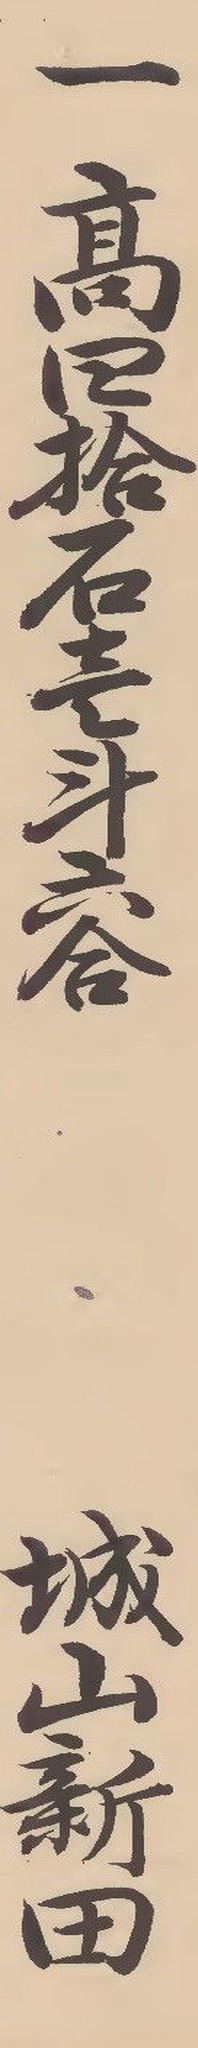一高四拾石壱斗六合城山新田
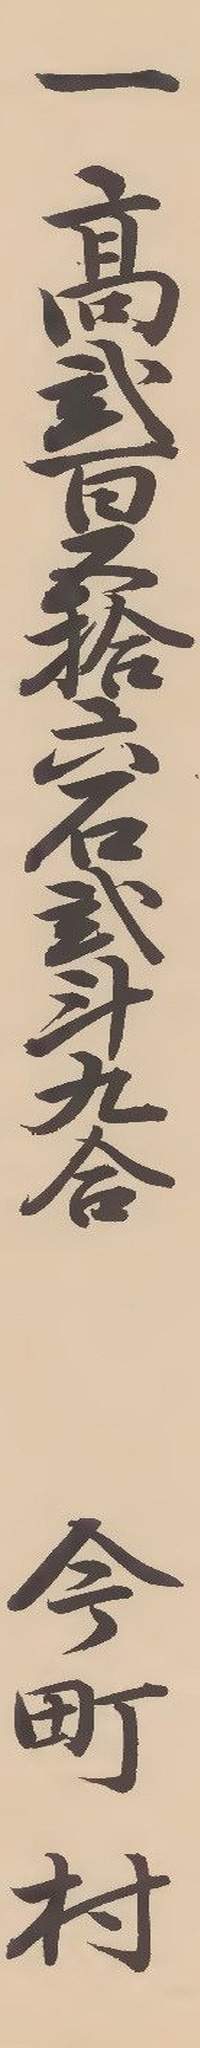一高弐百五拾六石弐斗九合今町村
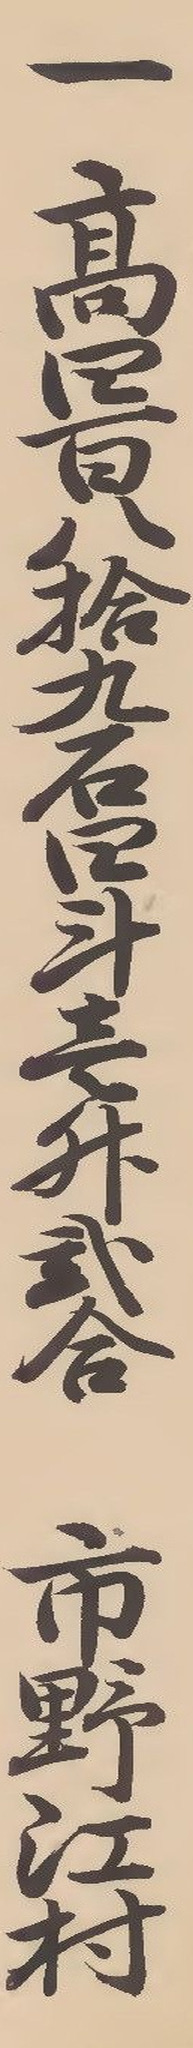一高四百八拾九石四斗壱升弐合市野江村
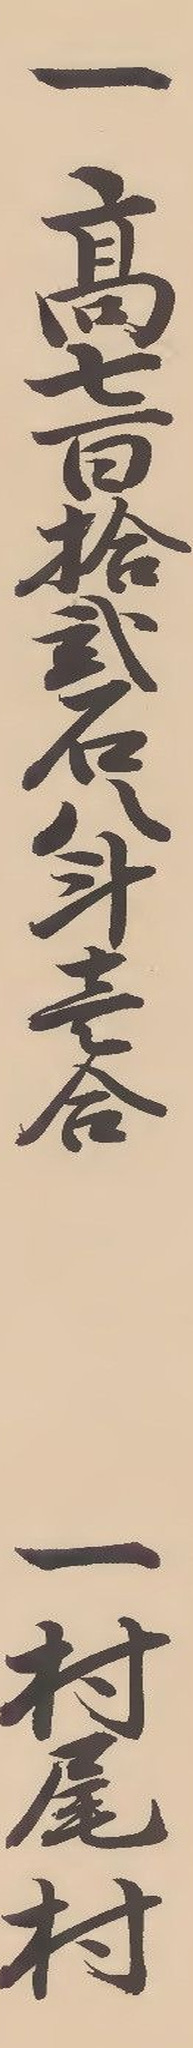一高七百拾弐石八斗壱合一村尾村
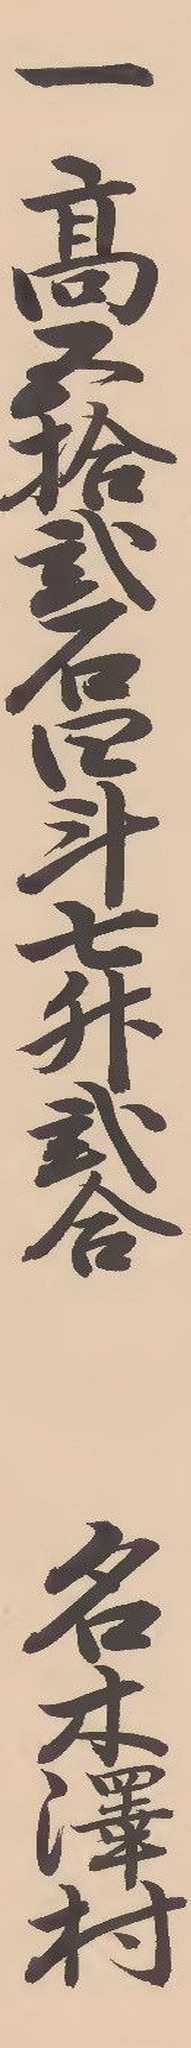一高五拾弐石四斗七升弐合名木沢村
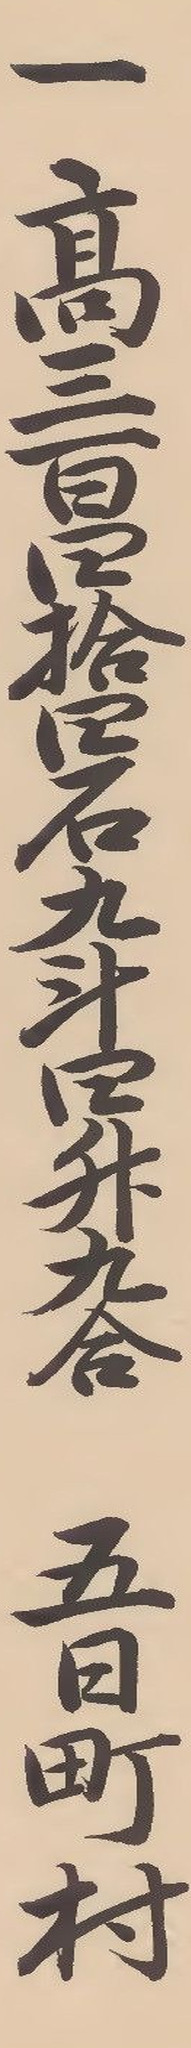一高三百四拾四石九斗四升九合五日町村
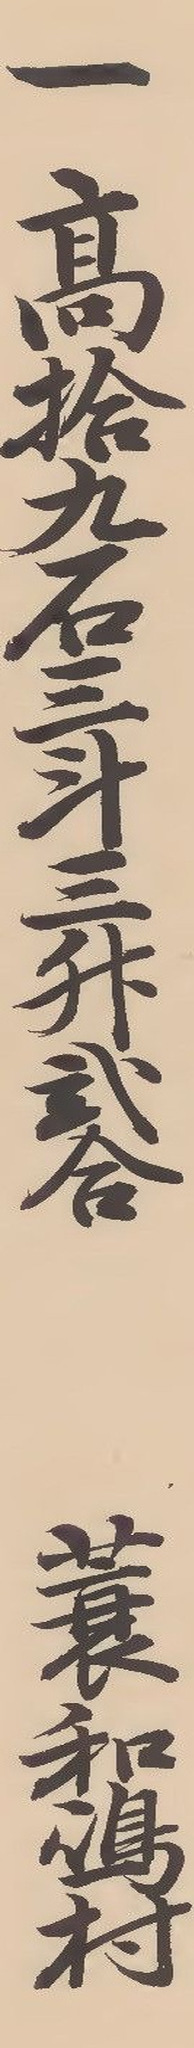一高拾九石三斗三升弐合蓑和島村
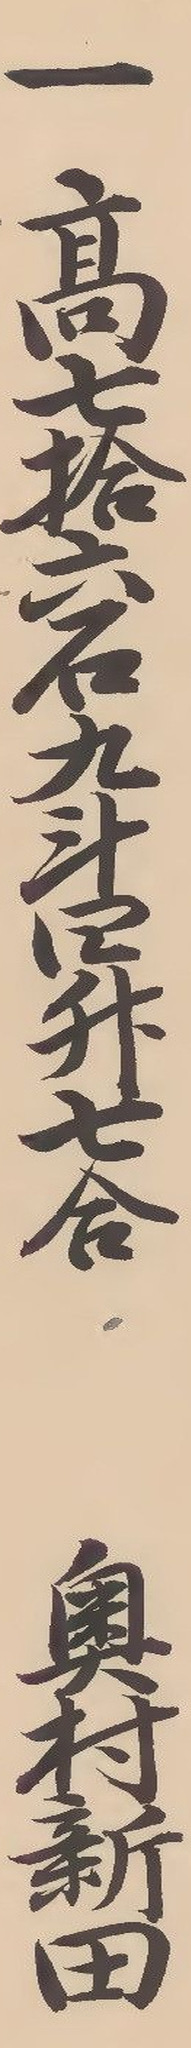一高七拾六石九斗四升七合奥村新田

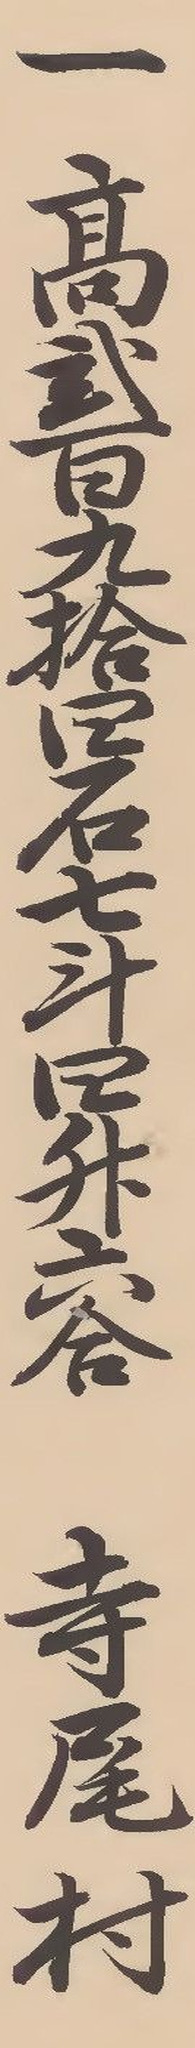一高弐百九拾四石七斗四升六合寺尾村
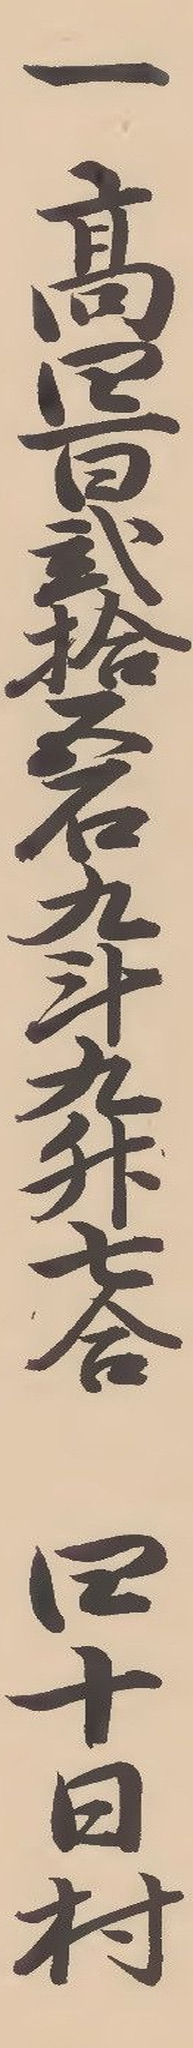一高四百弐拾五石九斗九升七合四十日村
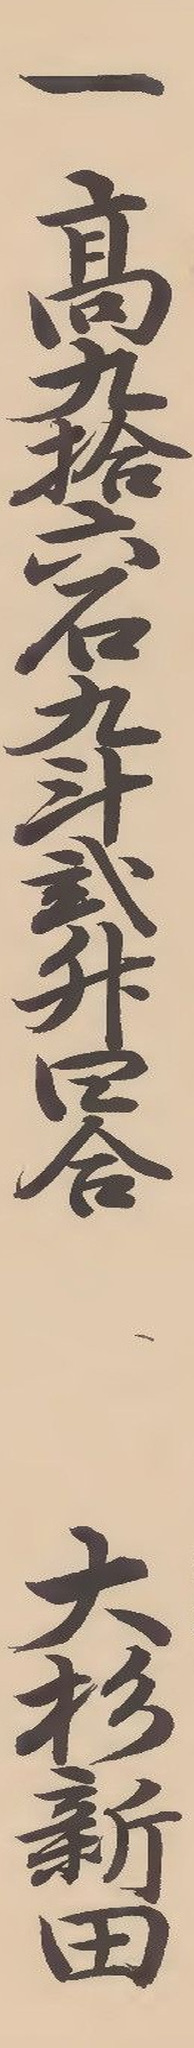一高九拾六石九斗弐升四合大杉新田
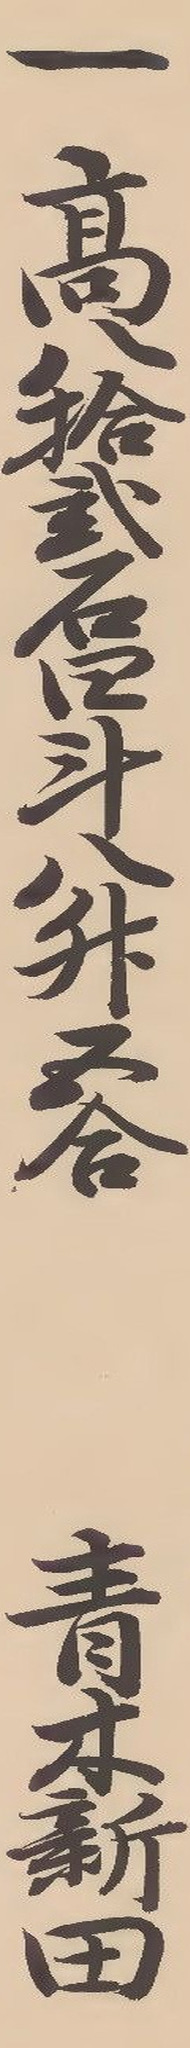一高八拾弐石四斗八升五合青木新田
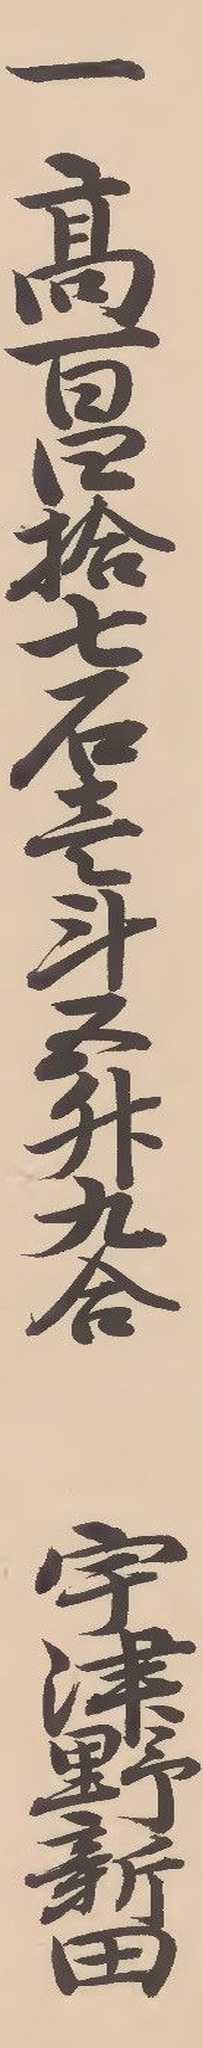一高百四拾七石壱斗五升九合宇津野新田
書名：越後国郷帳　中
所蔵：国立公文書館 National Archives of Japan
